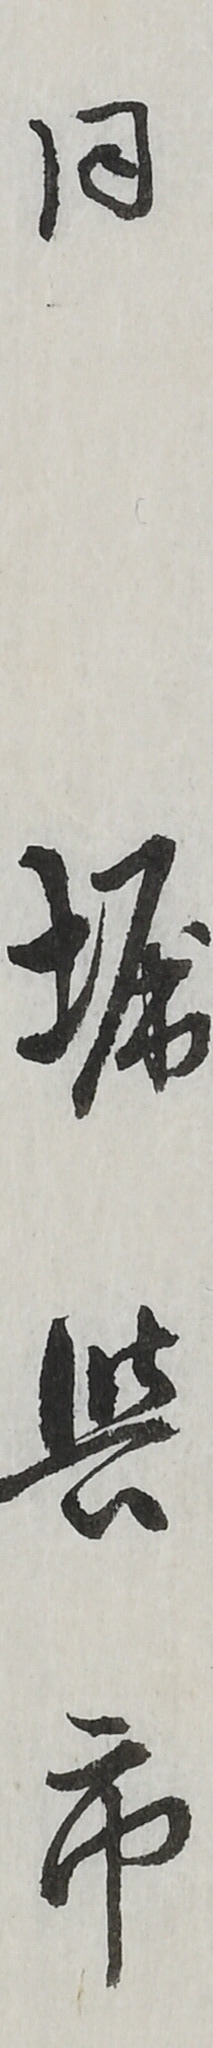同堀与市
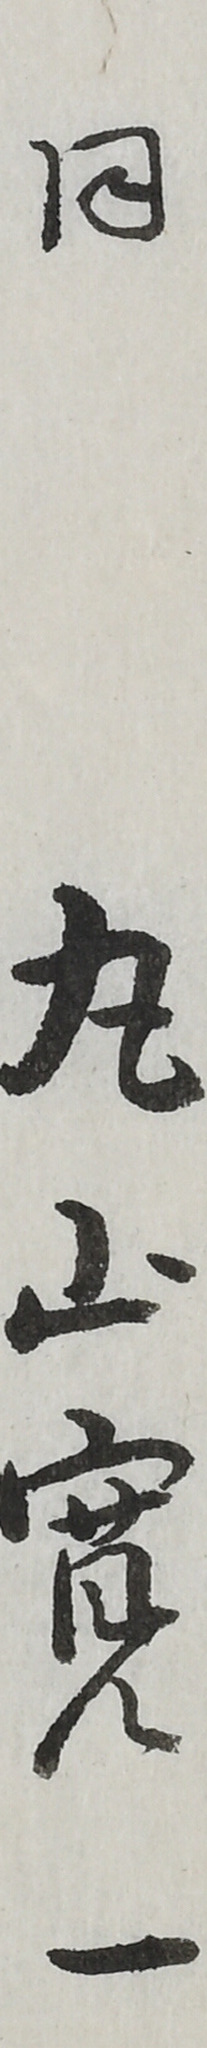同丸山寛一
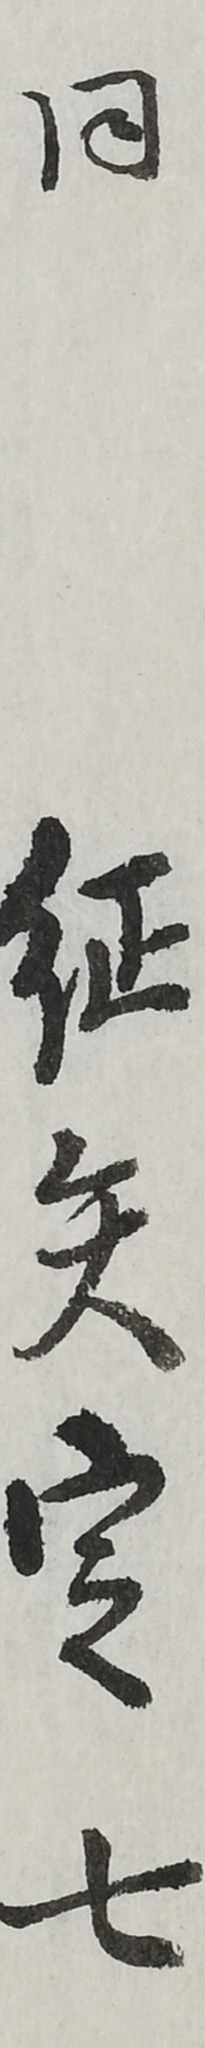同征矢定七
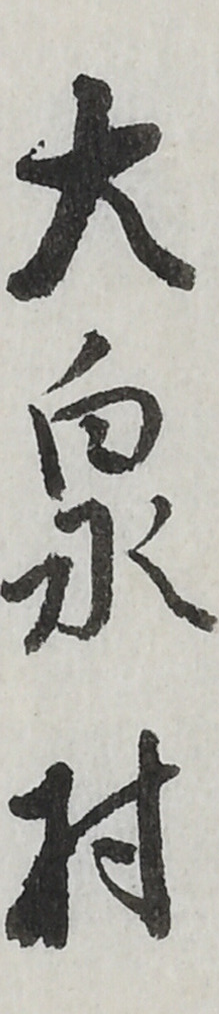大泉村

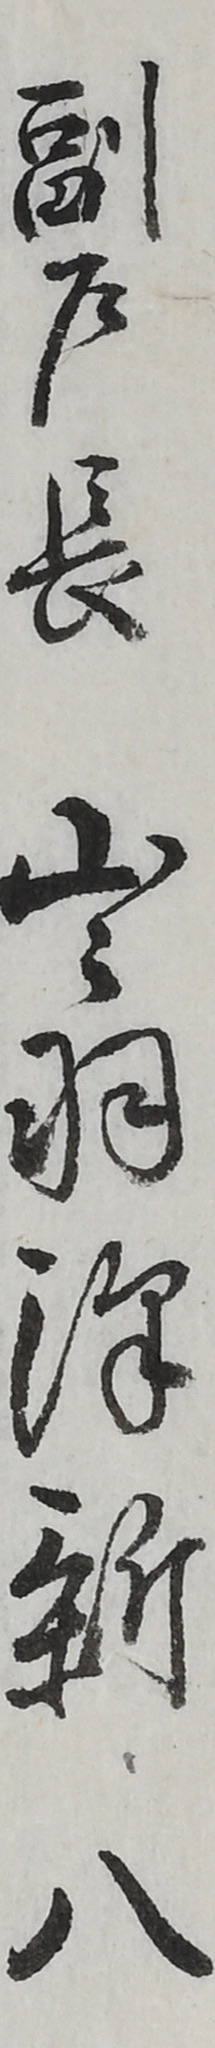副戸長出羽澤新八
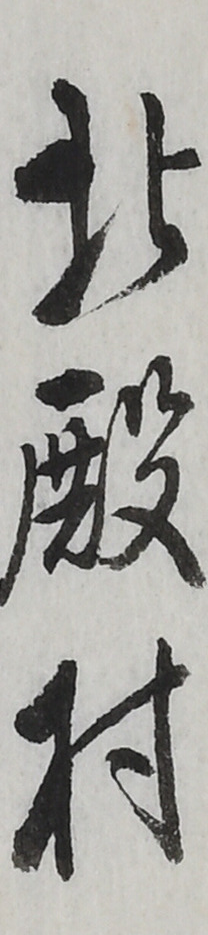北殿村
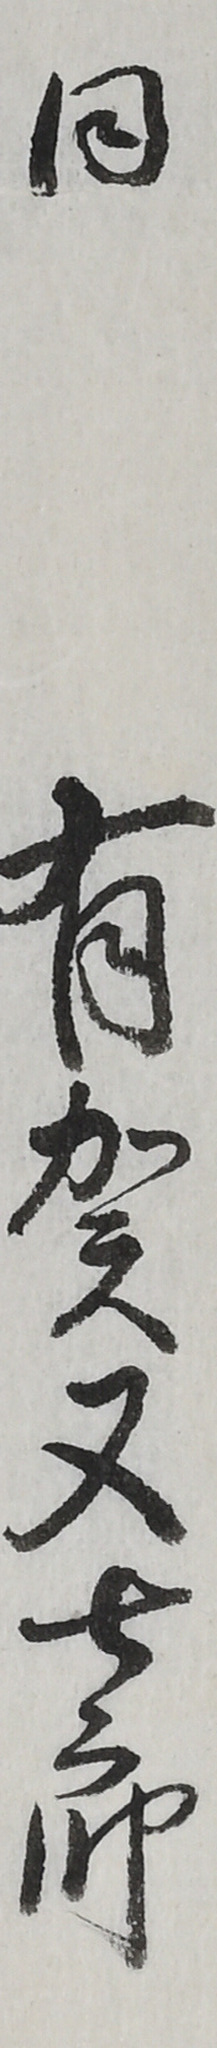同有賀又七郎
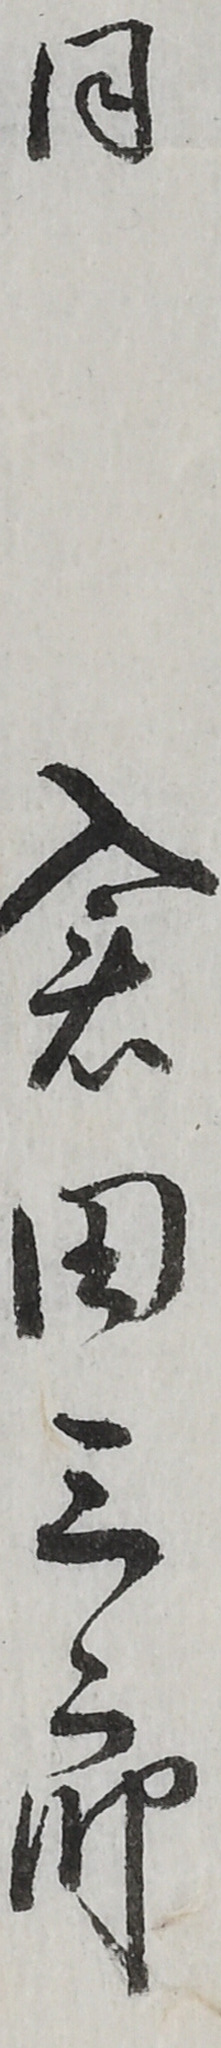同倉田三郎
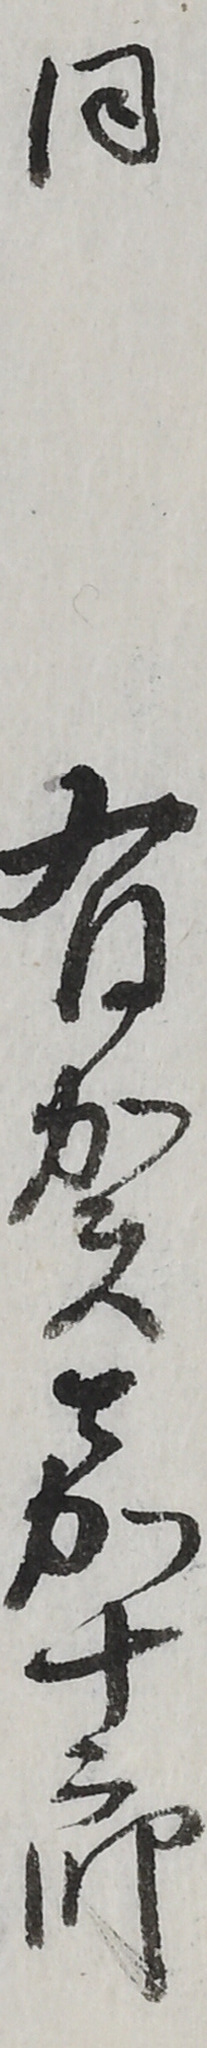同有賀嘉十郎
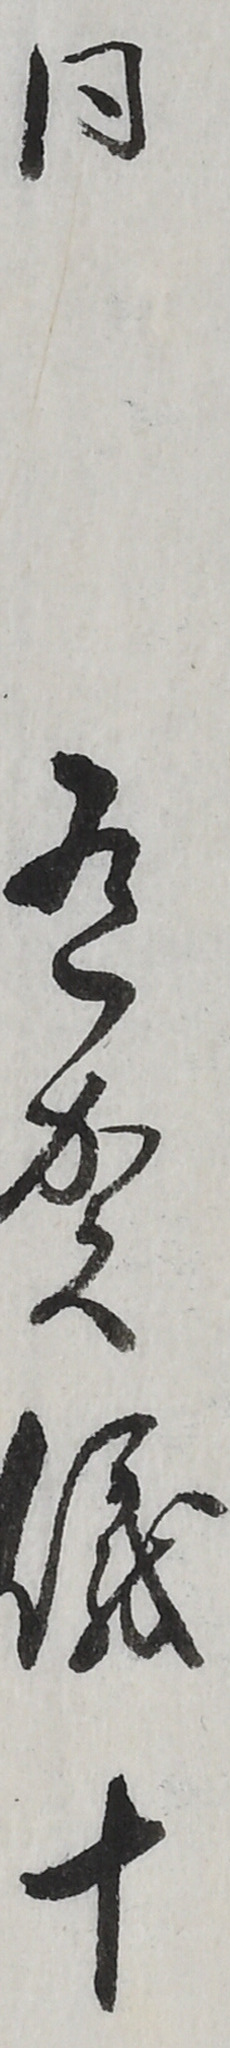同有賀儀十
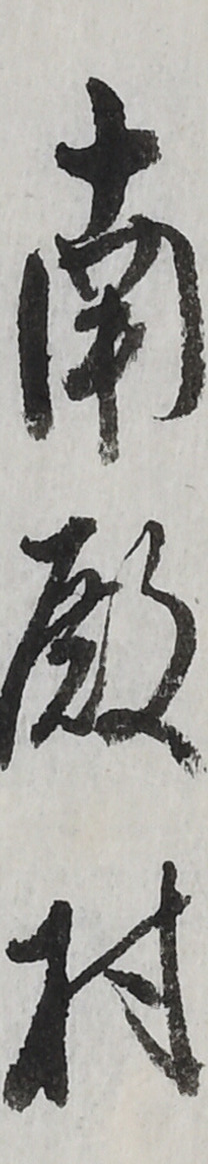南殿村
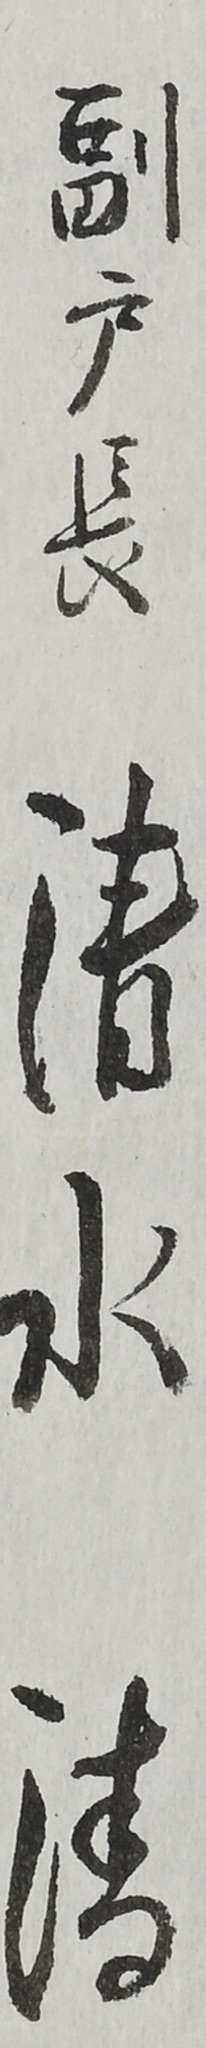副戸長清水清
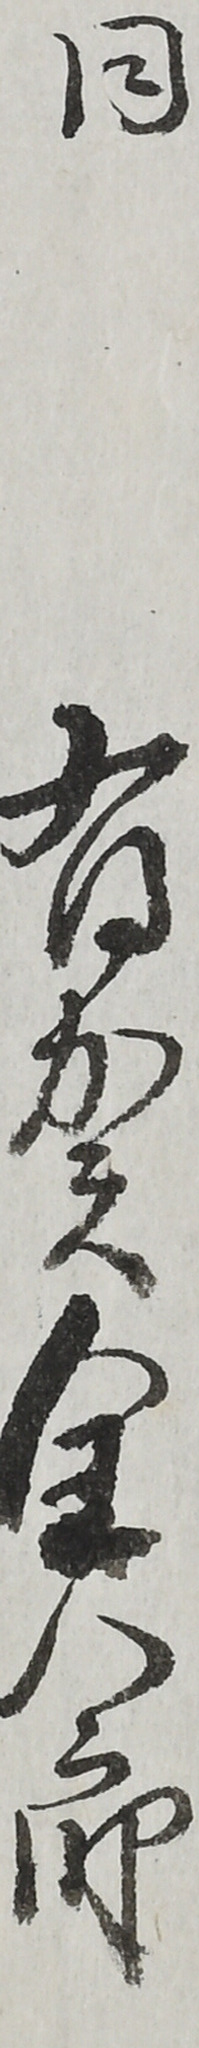同有賀金八郎
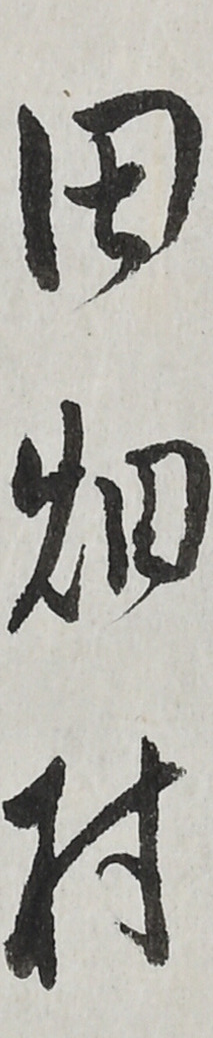田畑村
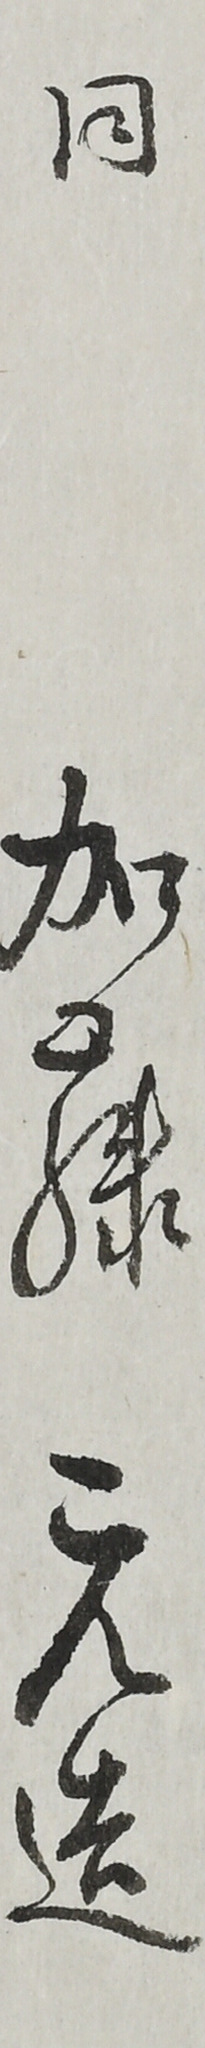同加藤元造
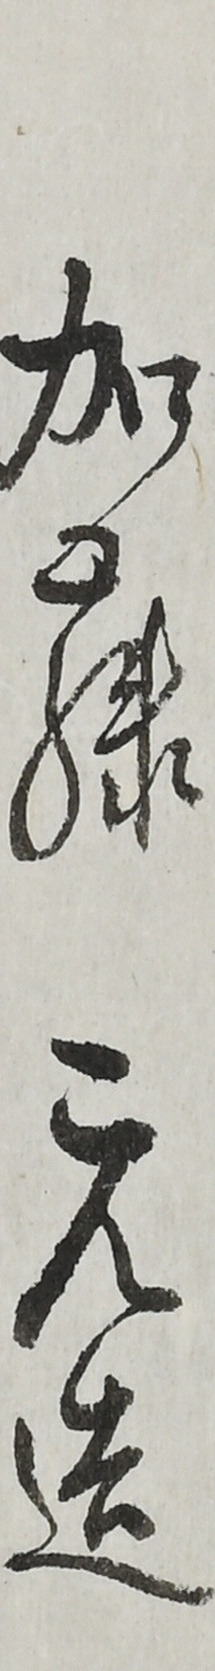同加藤元造
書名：伊那郡毎村戸長副戸長名簿
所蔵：伊那市立高遠町図書館・合同会社AMANE
